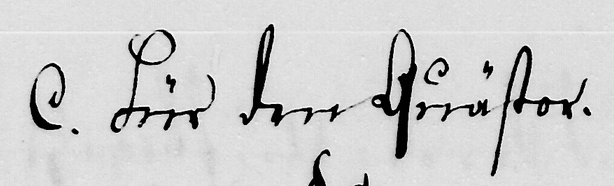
C. Für den Quästor.
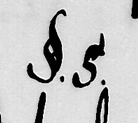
§.5.
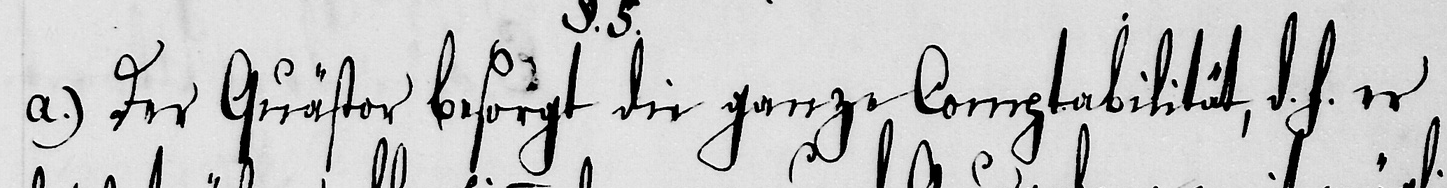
a.) Der Quästor besorgt die ganze Comptabilität, d. h. er
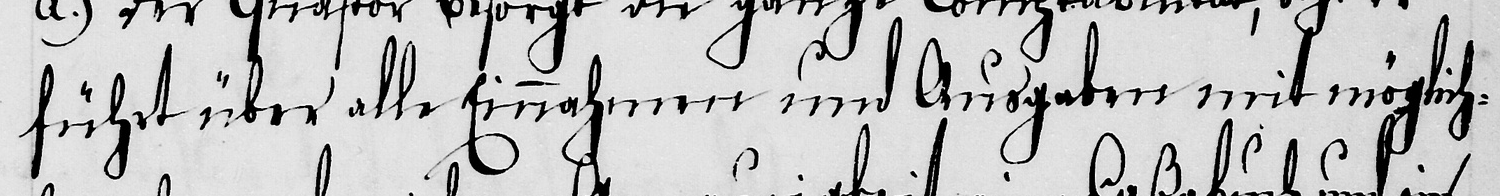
führt über alle Einnahmen und Ausgaben mit möglich¬
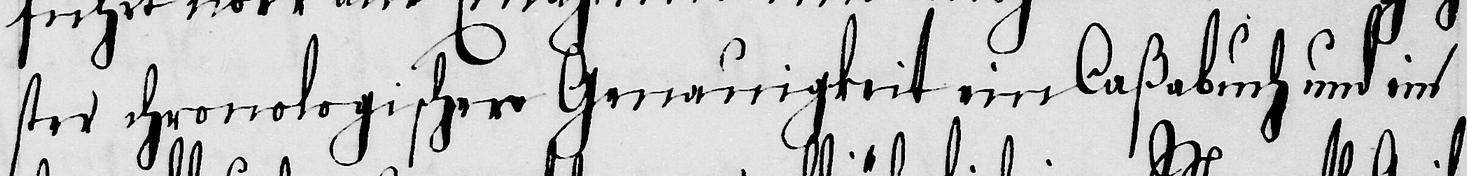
ster chronologischer Genauigkeit ein Caßabuch und im
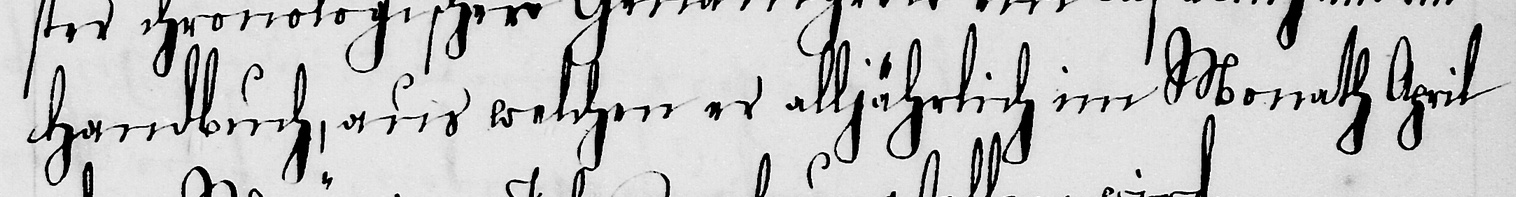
Handbuch, aus welchen er alljährlich im Monath April
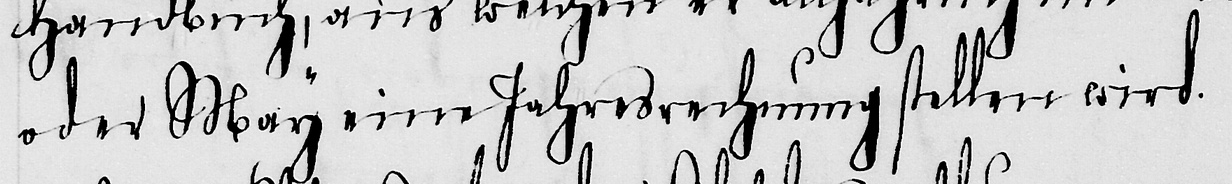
oder May eine Jahresrechnung stellen wird.
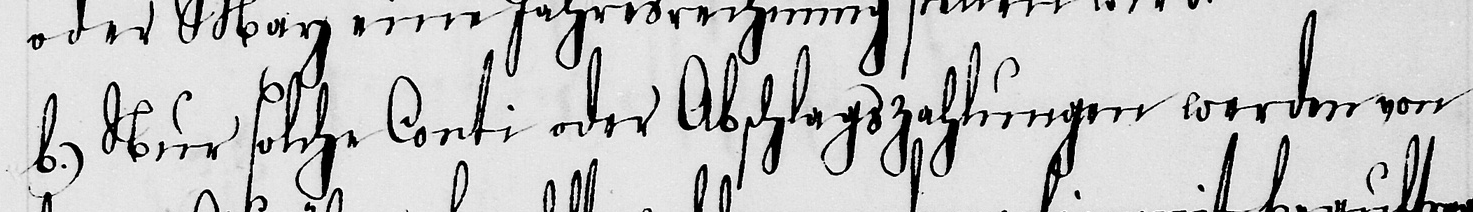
b.) Nur solche Conti oder Abschlagszahlungen werden von
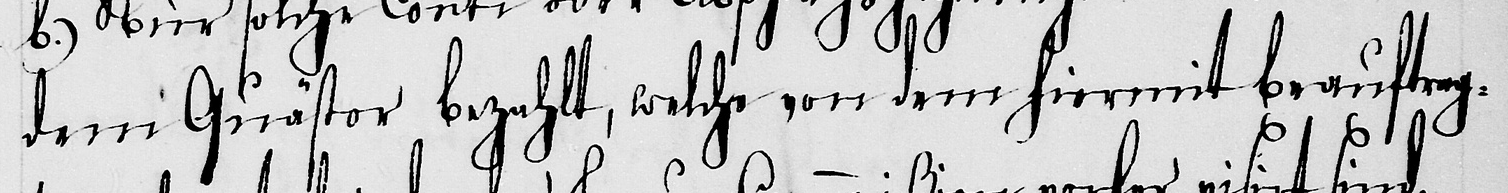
dem Quästor bezahlt, welche von dem hiermit beauftrag¬
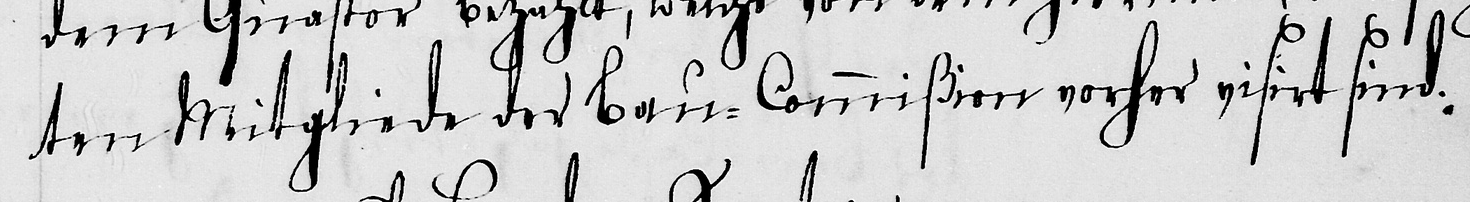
ten Mitgliede der Bau-Commißion vorher visirt sind.
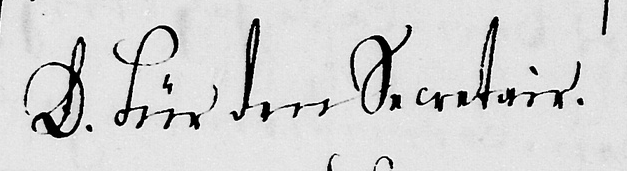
D. Für den Secretair.
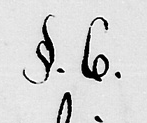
§.6.
